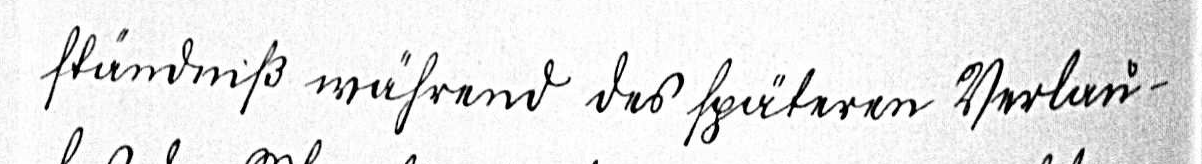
ständnis während des späteren Verlau¬
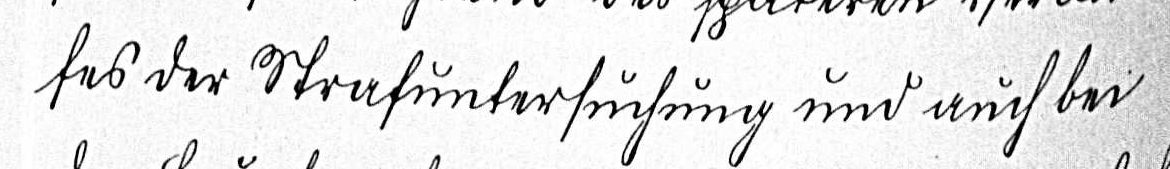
fes der Strafuntersuchung und auch bei
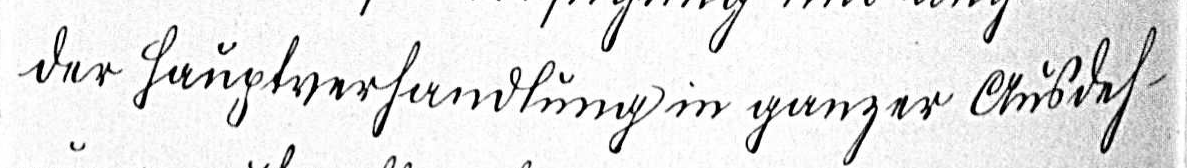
der Hauptverhandlung in ganzer Ausdeh¬
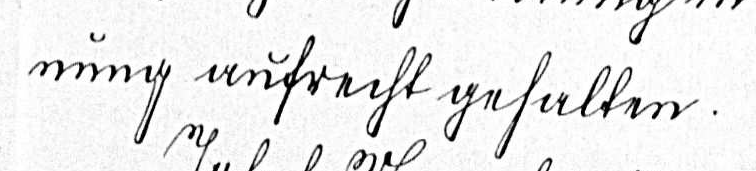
nung aufrecht gehalten.
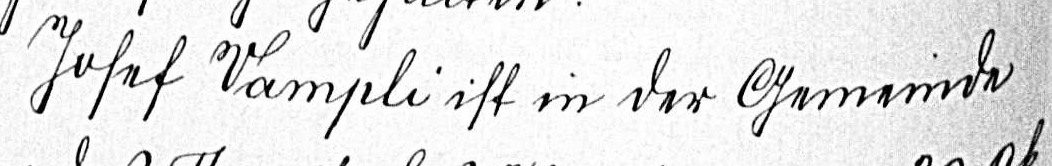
Josef Vampli ist in der Gemeinde
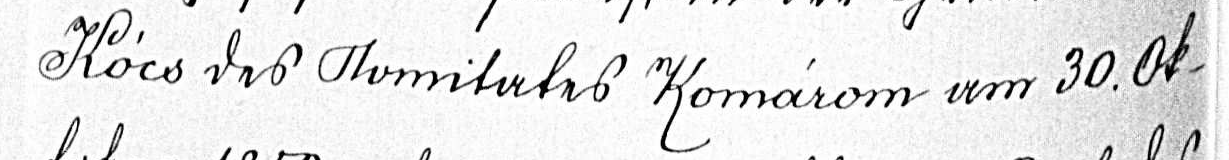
Kócs des Komitates Komárom am 30. Ok
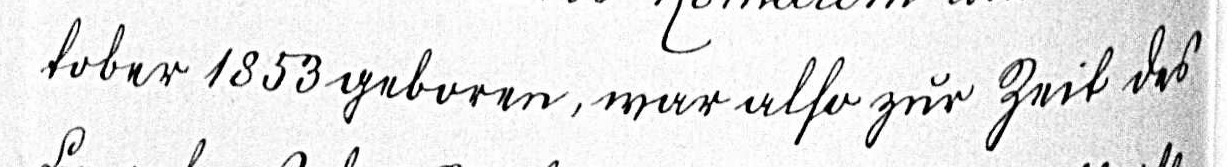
tober 1853 geboren, war also zur Zeit des
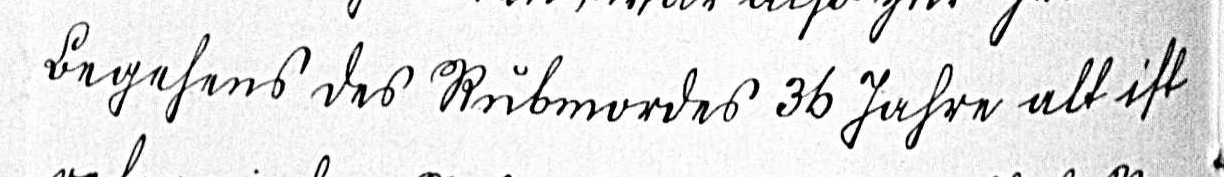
Begehens des Raubmordes 36 Jahre alt ist
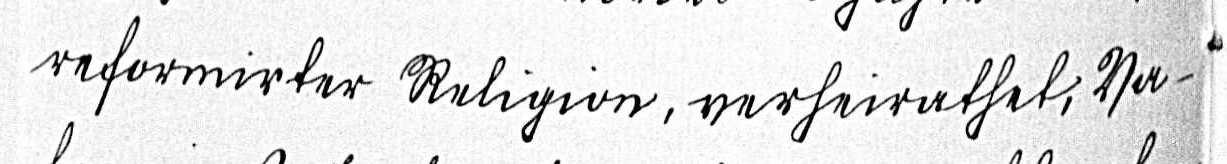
reformirter Religion, verheirathet, Va¬
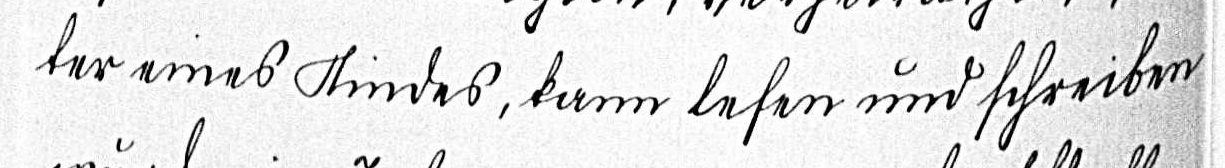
ter eines Kindes, kann lesen und schreiben
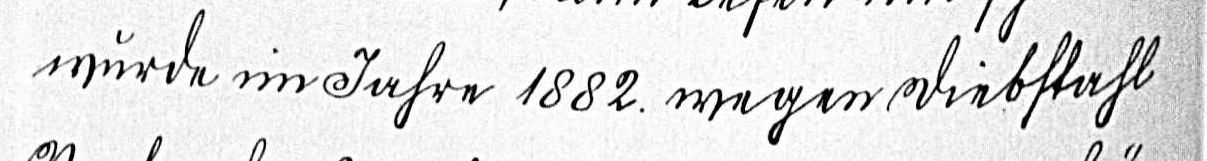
wurde im Jahre 1882 wegen Diebstahl
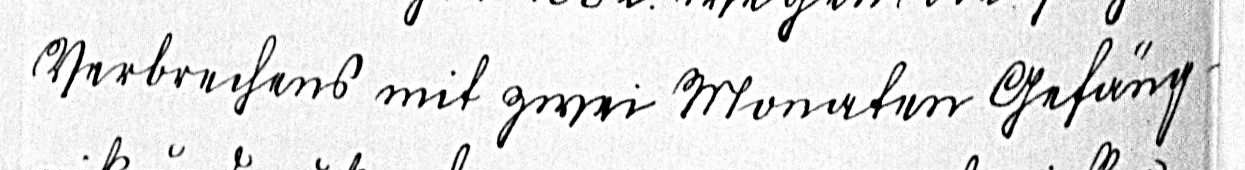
Verbrechens mit zwei Monaten Gefäng¬
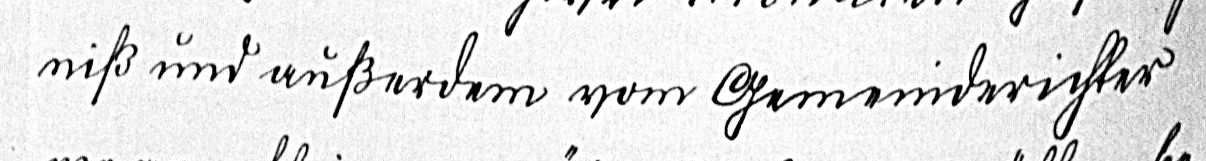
niß und außerdem vom Gemeinderichter
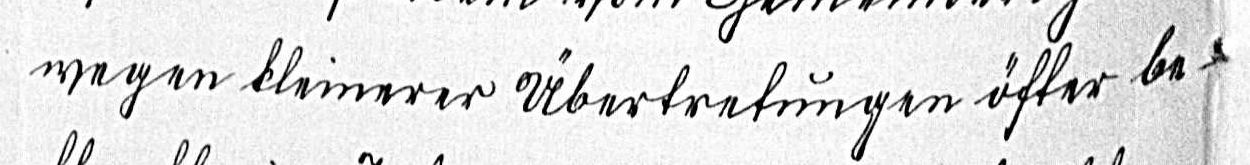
wegen kleinerer Übertretungen öfter be¬
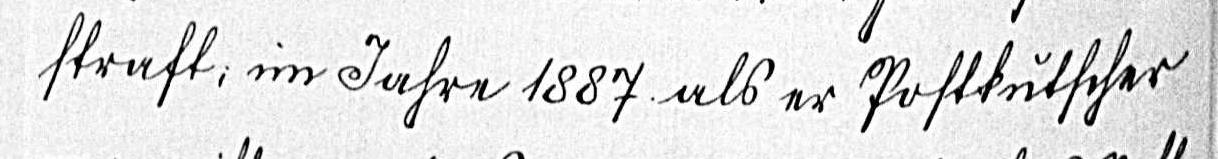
straft; im Jahre 1887 als er Postkutscher
